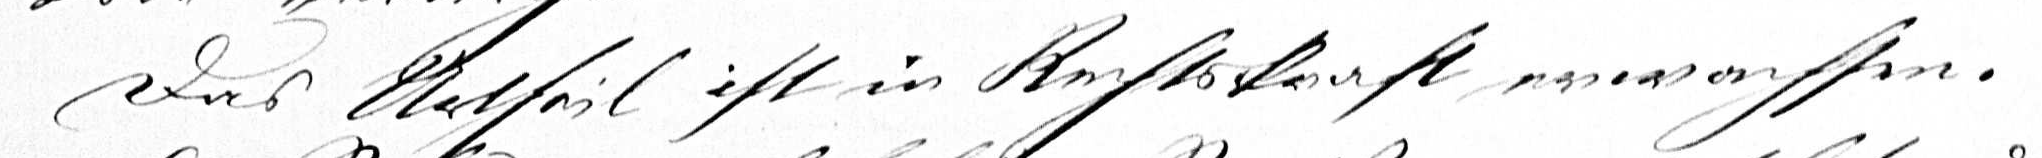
Das Urtheil ist in Rechskraft erwachsen.
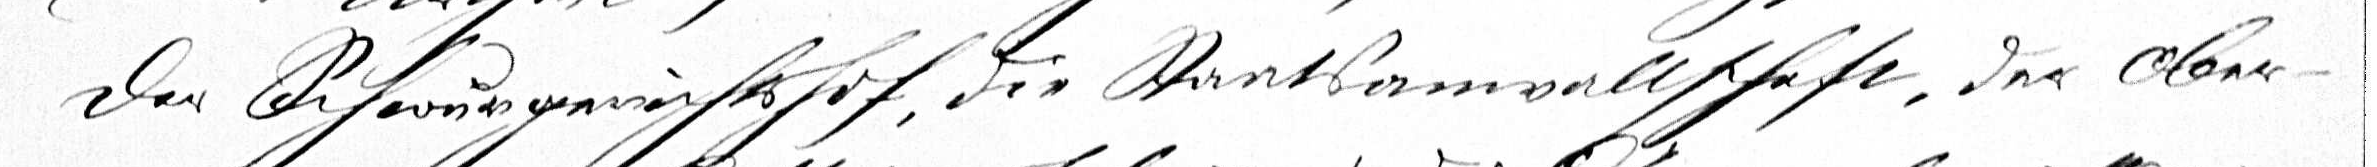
Der Schwurgerichtshof, die Staatsanwaltschaft, der Ober¬
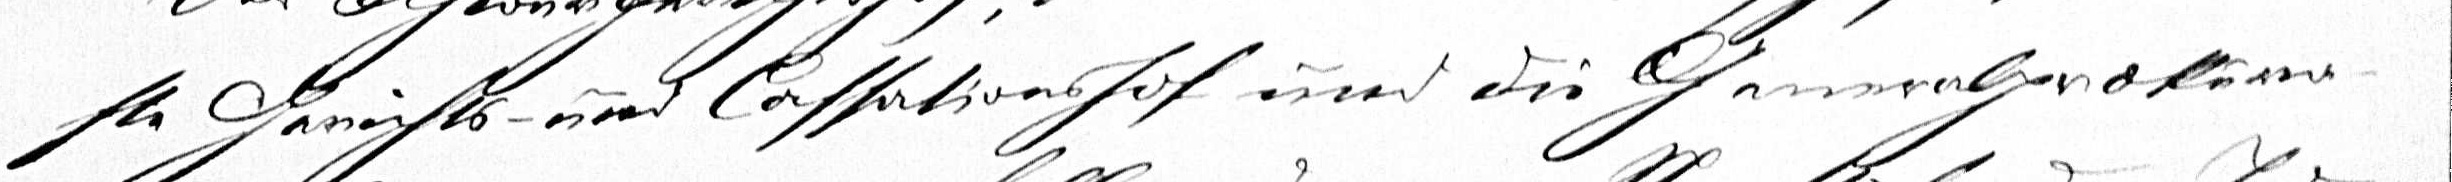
ste Gerichts- und Cassationshof und die Generalprokura¬
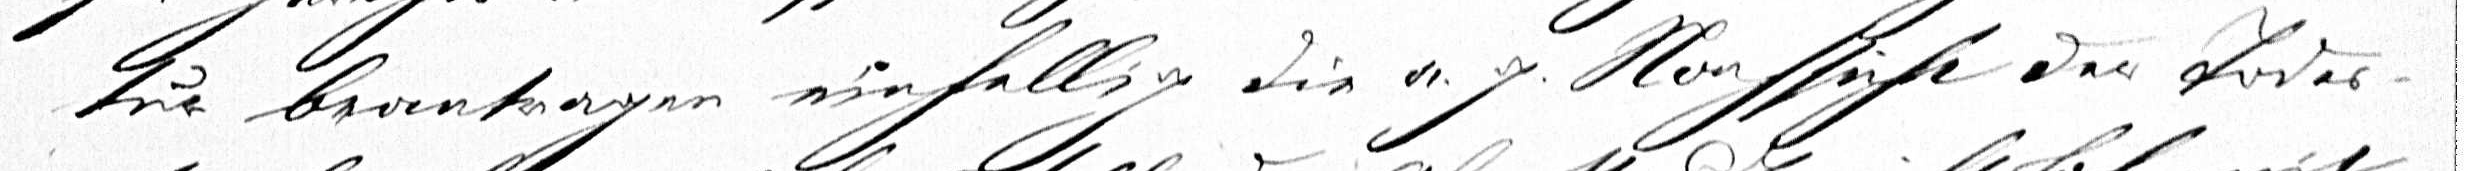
tur beantragen einhellig die a. g. Nachsicht der Todes¬
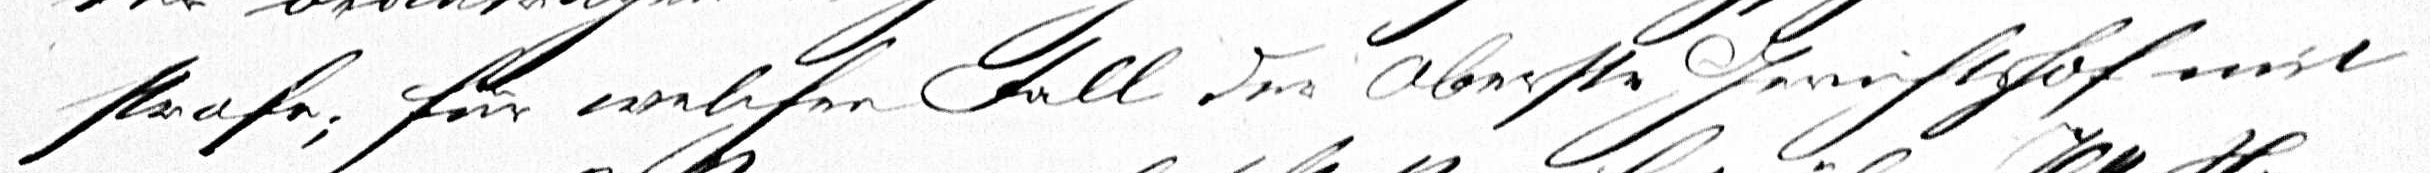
strafe; für welchen Fall der Oberste Gerichtshof mit
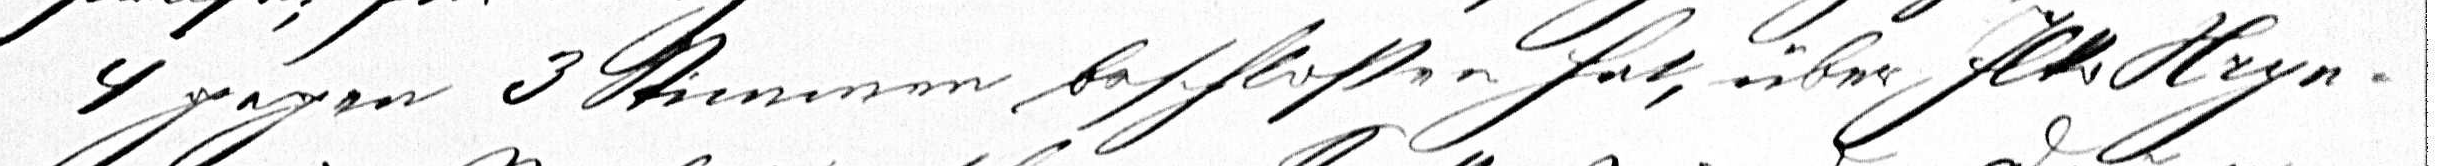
4 gegen 3 Stimmen beschloßen hat, über Jlko Hryn¬
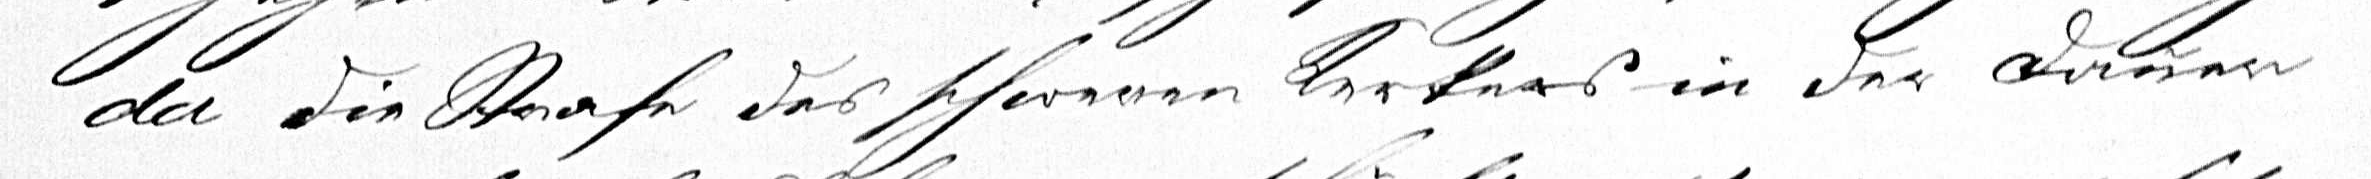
da die Strafe des schweren Kerkers in der Dauer
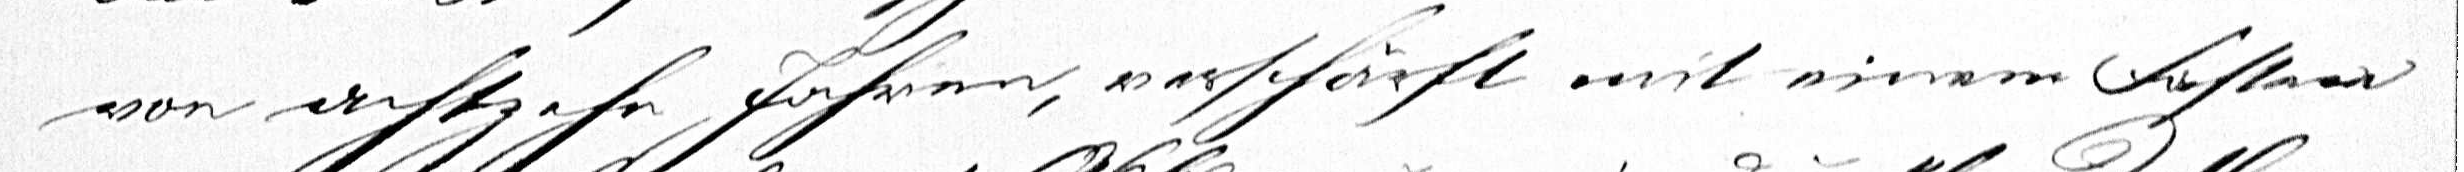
von achtzehn Jahren, verschärft mit einem Fasten
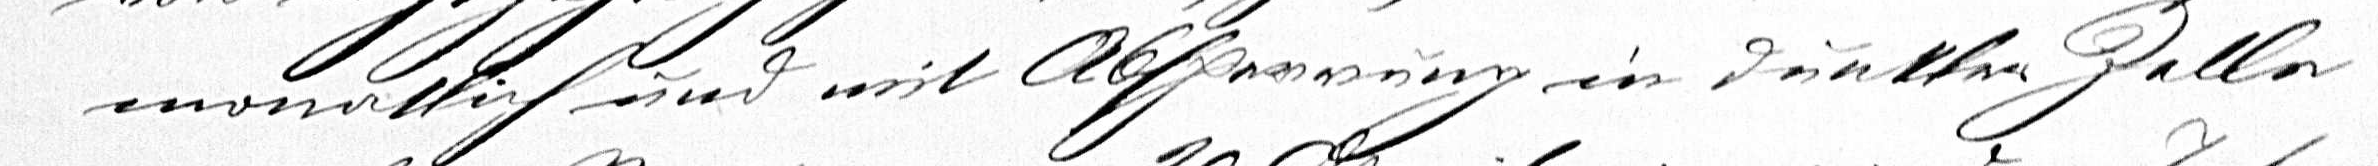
monatlich und mit Absperrung in dunkler Zelle
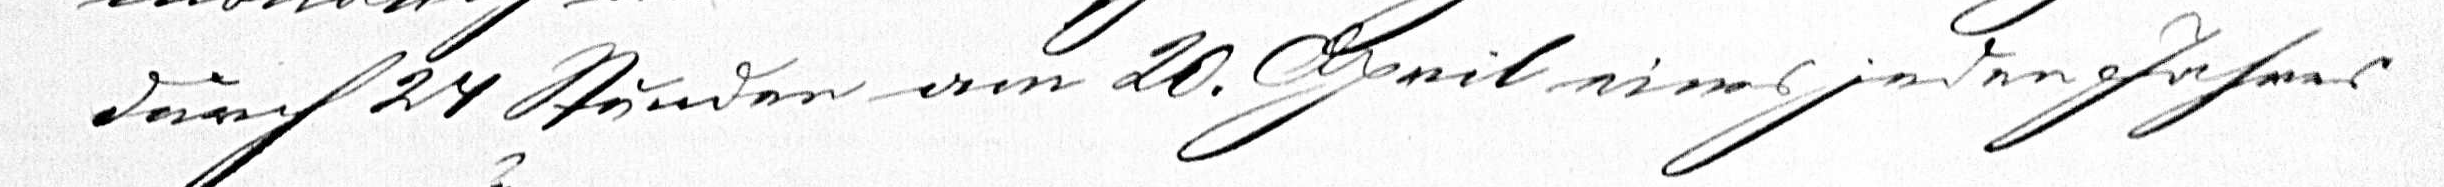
durch 24 Stunden am 20. April eines jeden Jahres
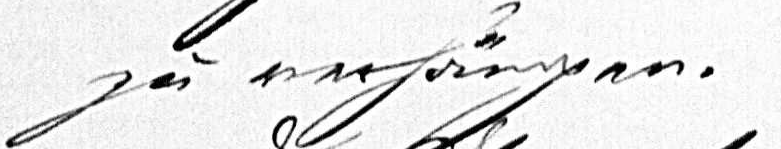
zu verhängen.
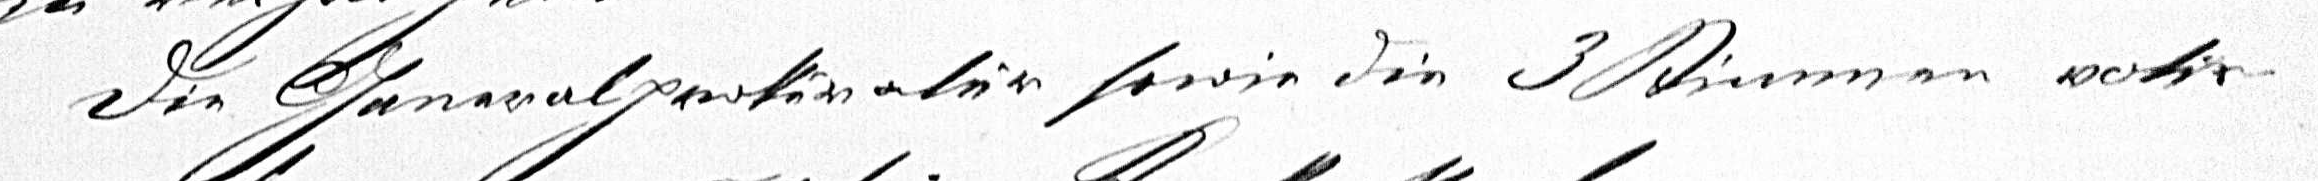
Die Generalprokuratur sowie die 3 Stimmen votir¬
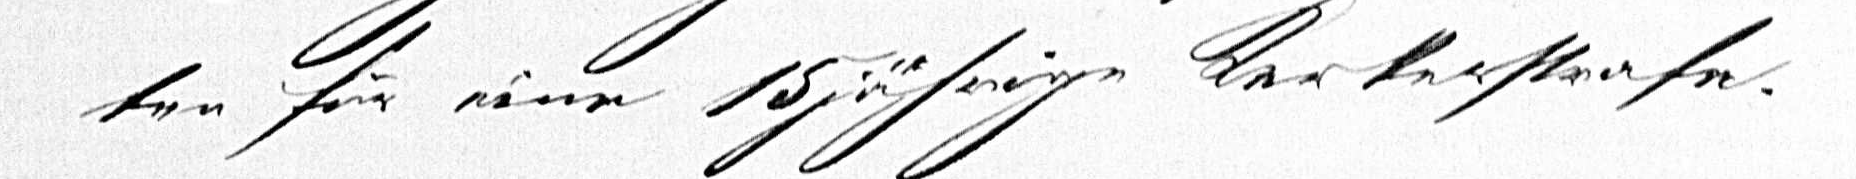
ten für eine 15jährige Kerkerstrafe.
